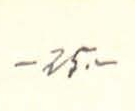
25.
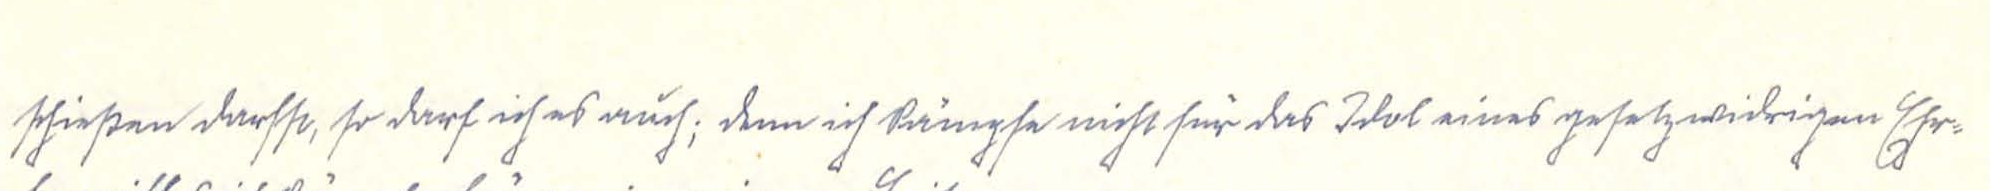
schießen darfst, so darf ich es auch; denn ich kämpfe nicht für das Idol eines gesetzwidrigen Ehr-
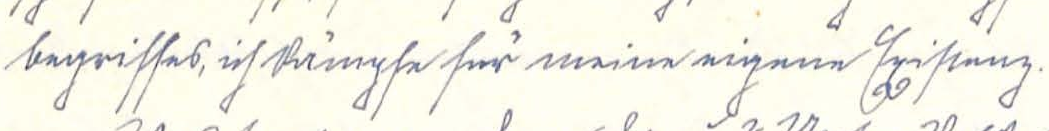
begriffes, ich kämpfe für meine eigene Existenz.
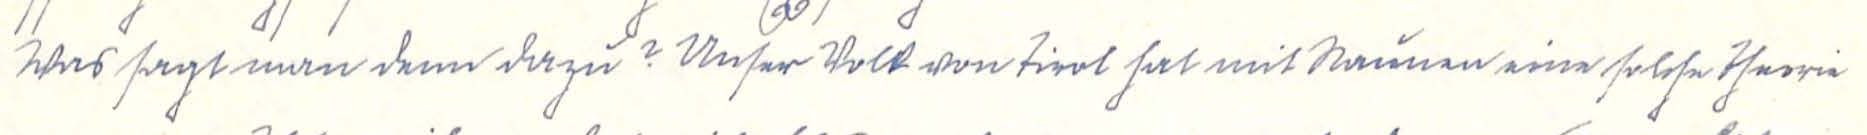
Was sagt man denn dazu? Unser Volk von Tirol hat mit Staunen eine solche Theorie
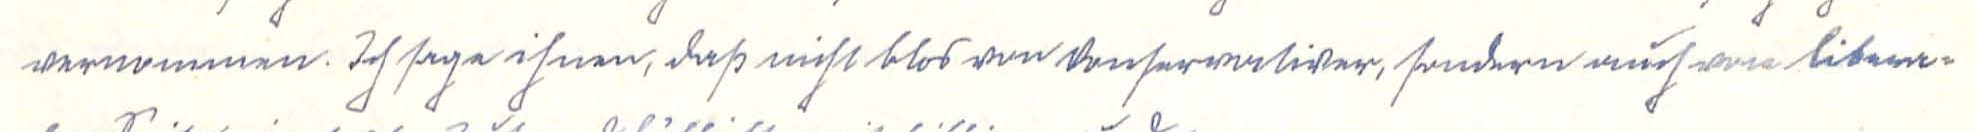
vernommen. Ich sage ihnen, daß nicht blos von konservativer, sondern auch von libera-
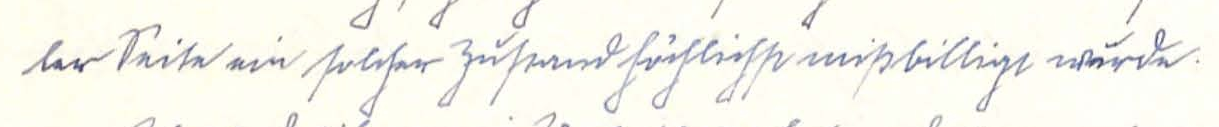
ler Seite ein solcher Zustand höchlichst mißbilligt wurde.
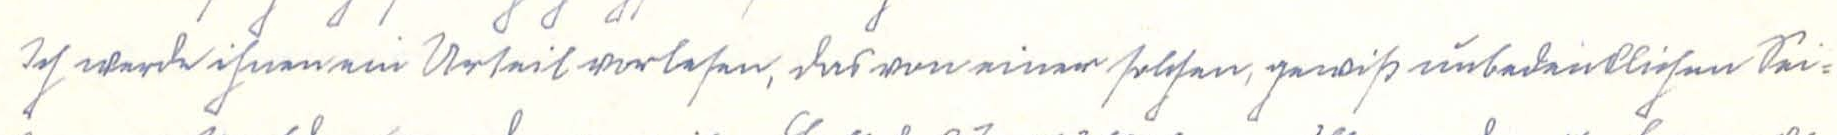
Ich werde ihnen ein Urteil vorlesen, das von einer solchen, gewiß unbedenklichen Sei-
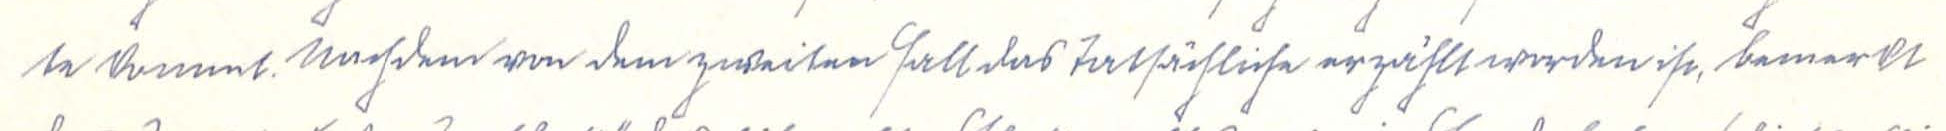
te komnmt. Nachdem von dem zweiten Fall das Tatsächliche erzählt worden ist, bemerkt
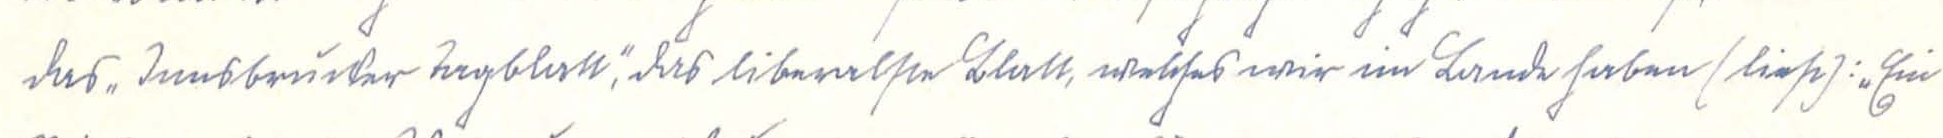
das „Innsbrucker Tagblatt", das liberalste Blatt, welches wir im Lande haben (liest); "Ein
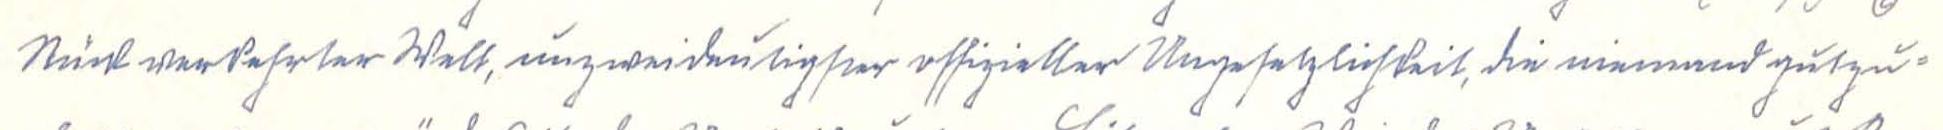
Stück verkehrter Welt, unzweideutigster offizieller Ungesetzlichkeit, die niemand gutzu-
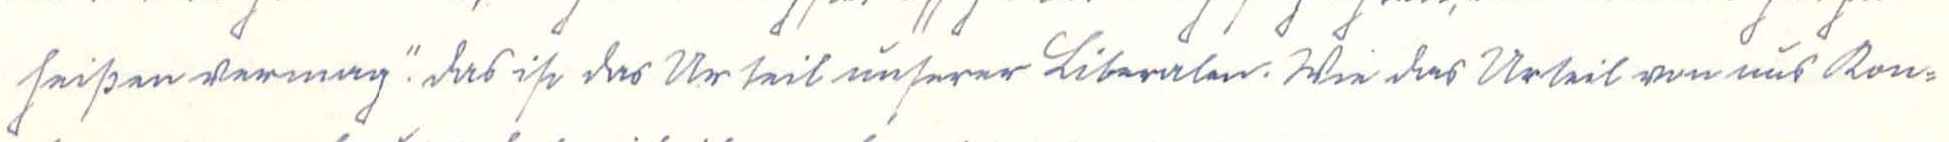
heißen vermag." Das ist das Urteil unserer Liberalen. Wie das Urteil von uns Kon-
